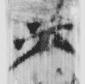亓
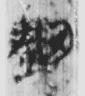型
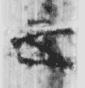正
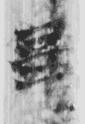是
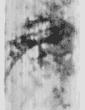不
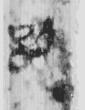攺
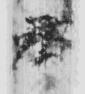不
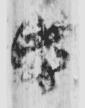悔
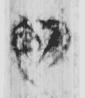初
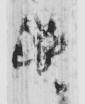{化心}
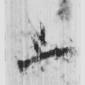之
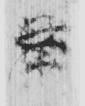不
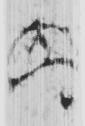立
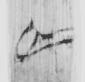亡
